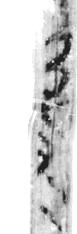○（爨）
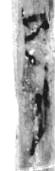獻
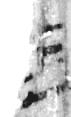馬
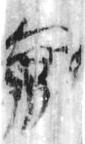○（秋）
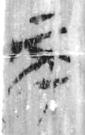不
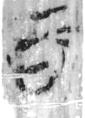可
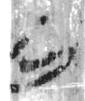㠯（以）
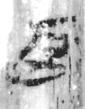西
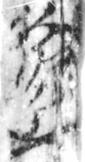○（徙）
